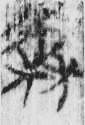秦
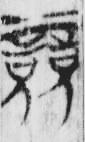競
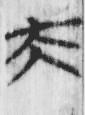夫
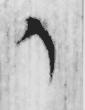人
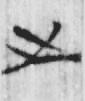之
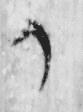人
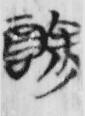○（舒）
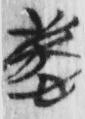慶
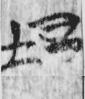坦
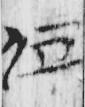凥
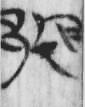陰
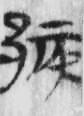○（侯）
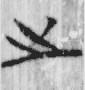之
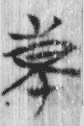東
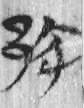躬
